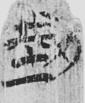型（刑）
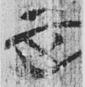正（政）
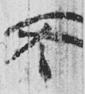不
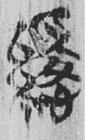○（緩）
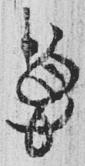惪（德）
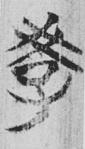○（教）
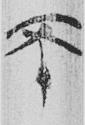不
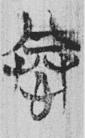○（倦）
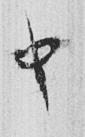中（仲）
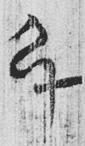弓
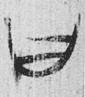曰
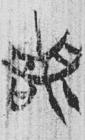若
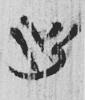此（此）
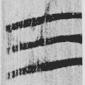三
